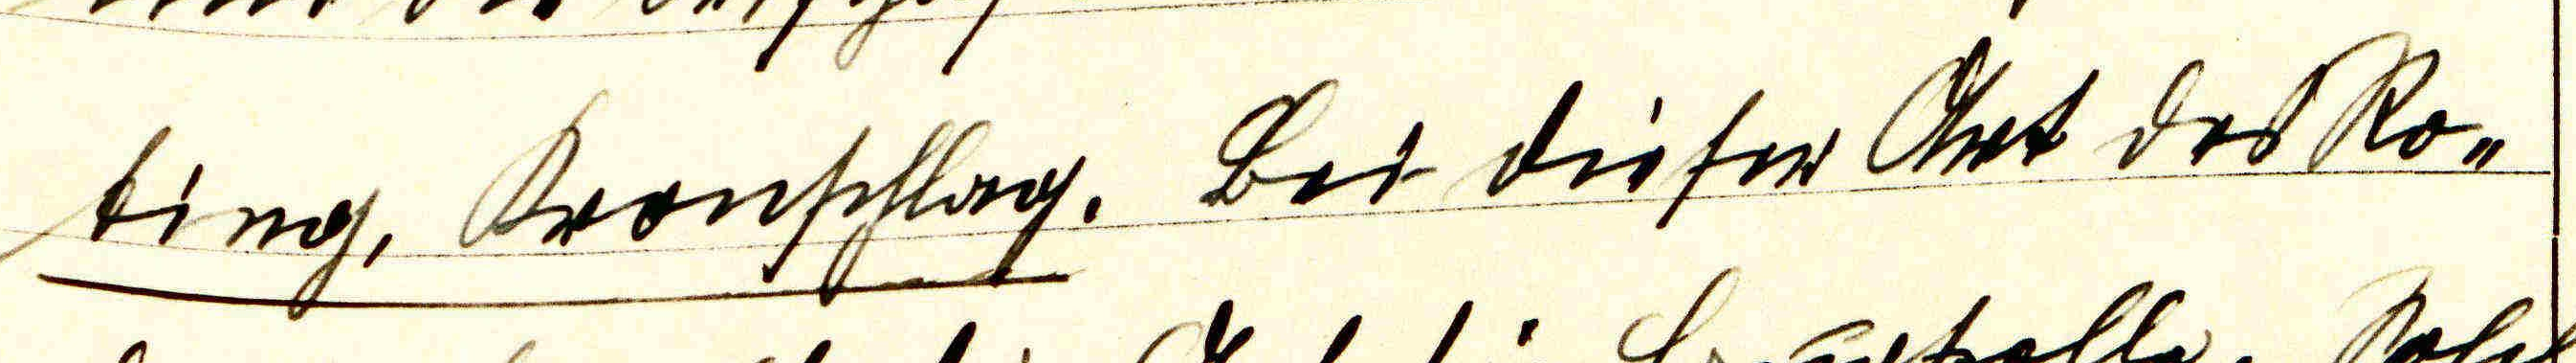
trag Koonssag. bei dieser Art des Vor
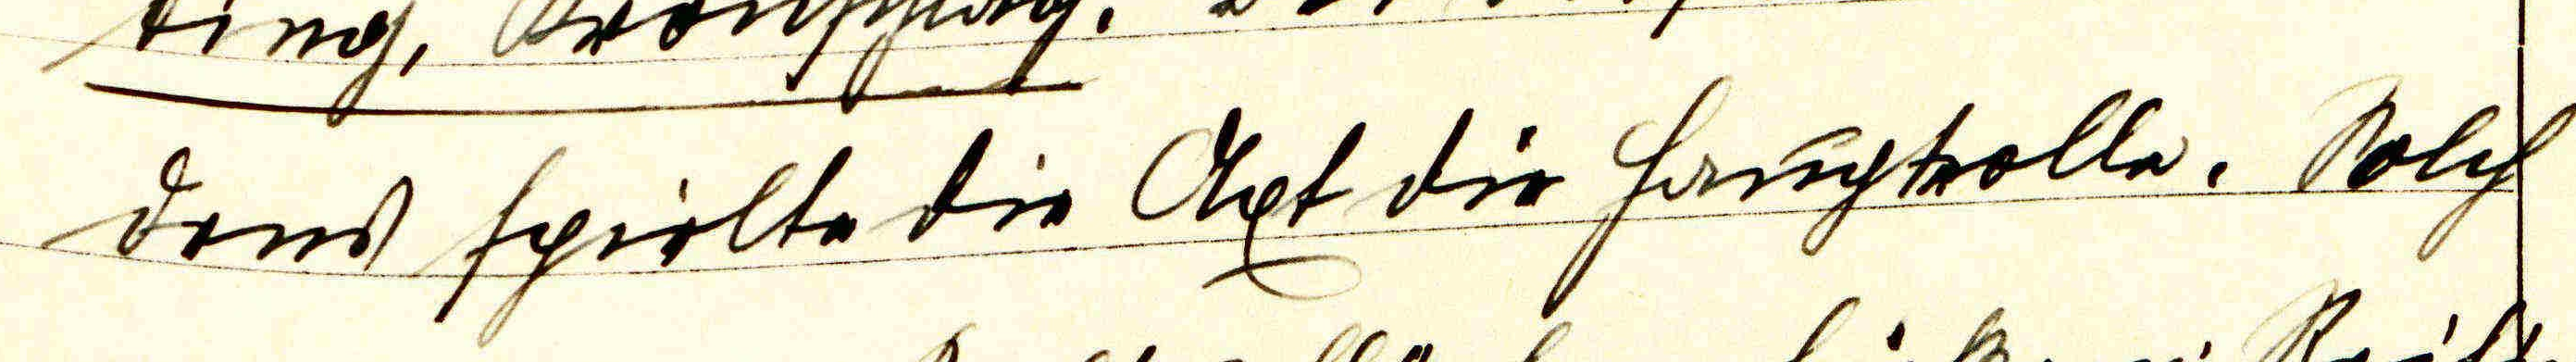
den spitte die Art die Eokstollg. Die¬
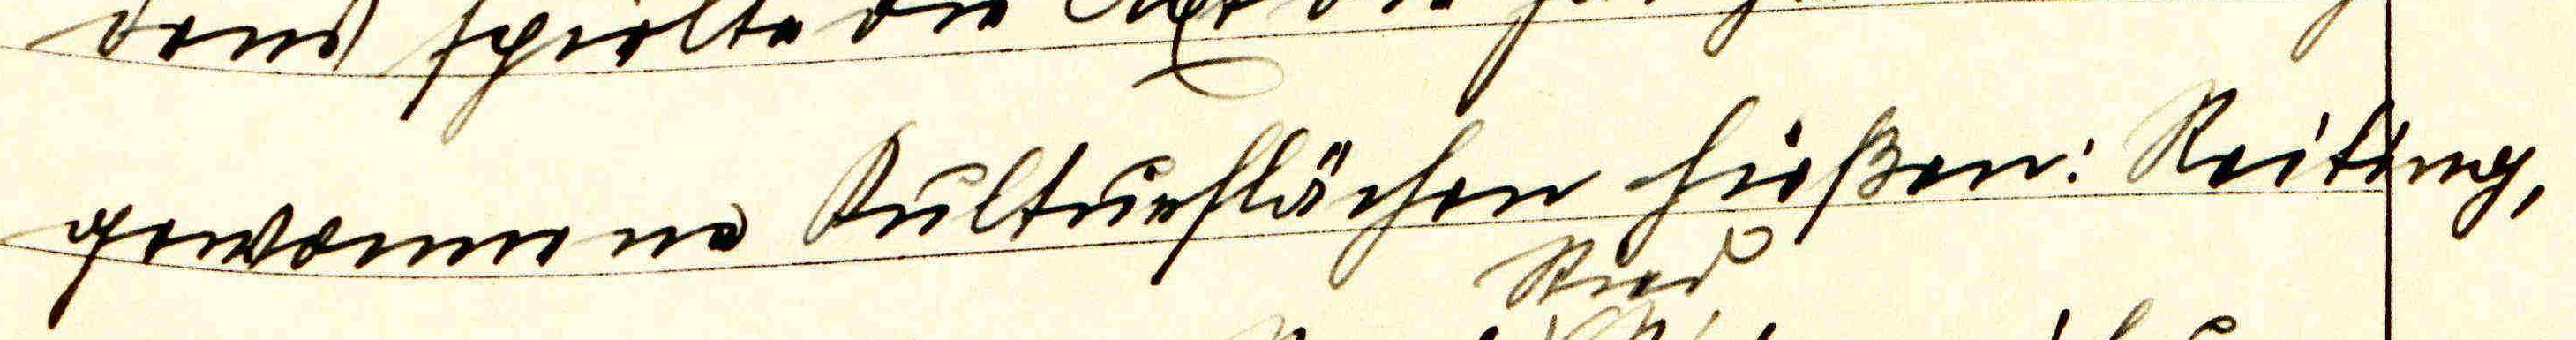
dem tbäslghten ließ. beiden,
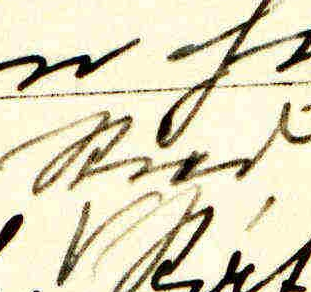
schon
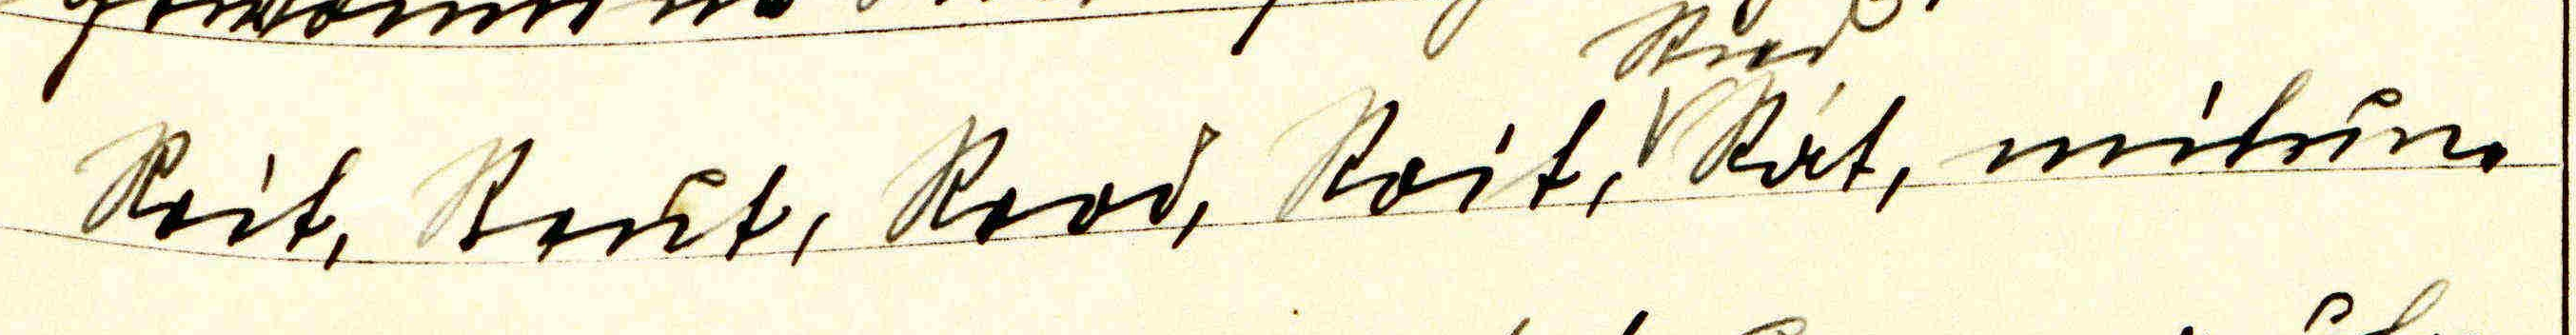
Seitens, und Seite Tat, weiteren
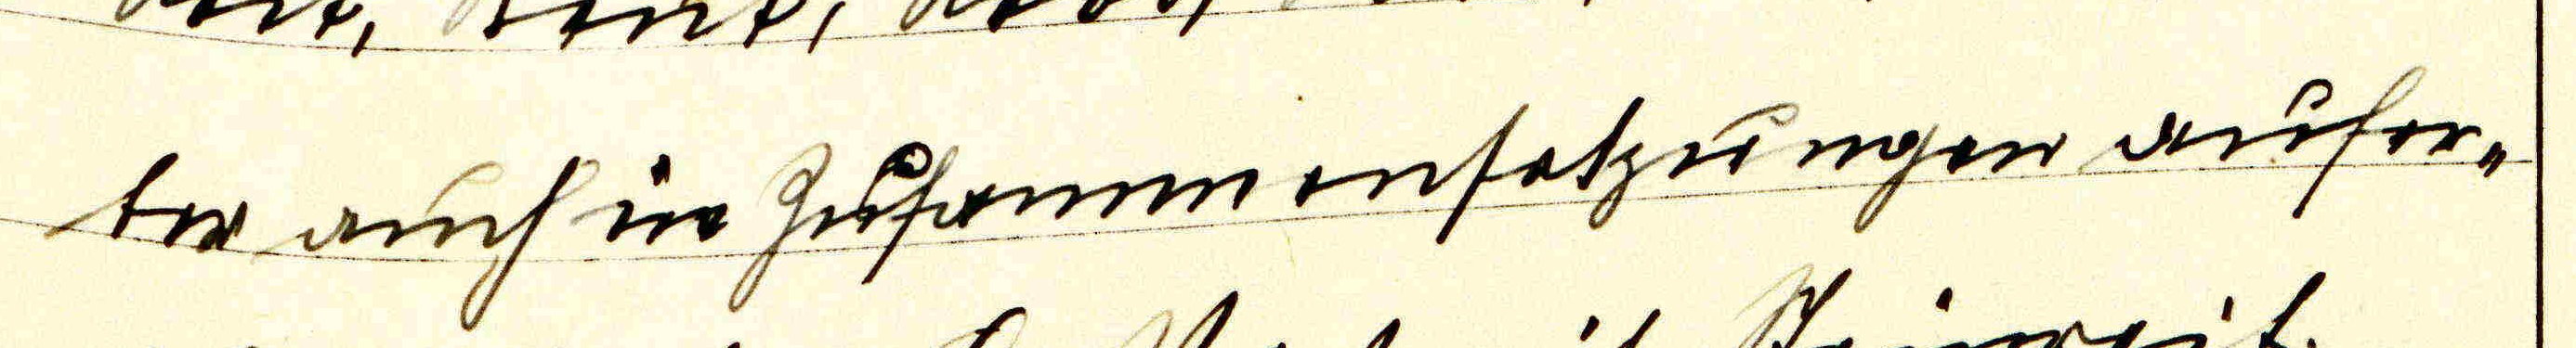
ber auch die hilfometnsetzngen bessere
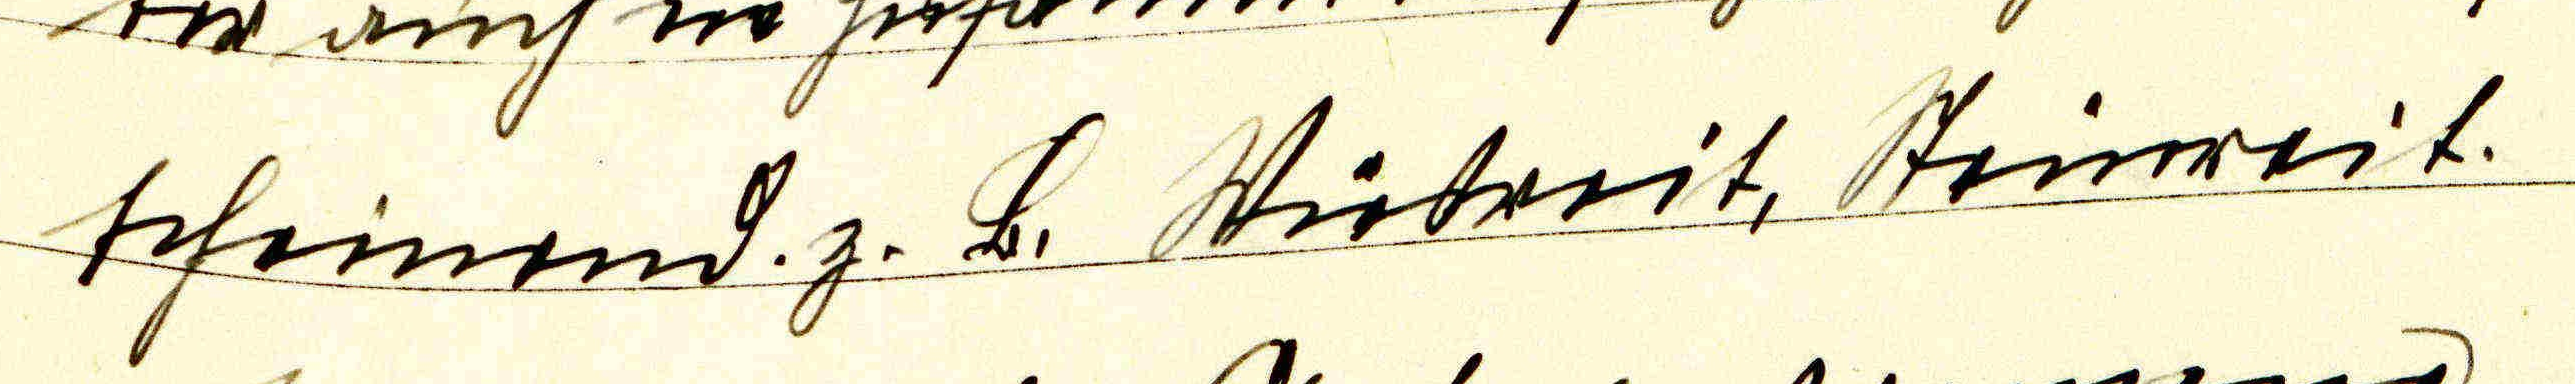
tefeiend ist B. richtet .bereits
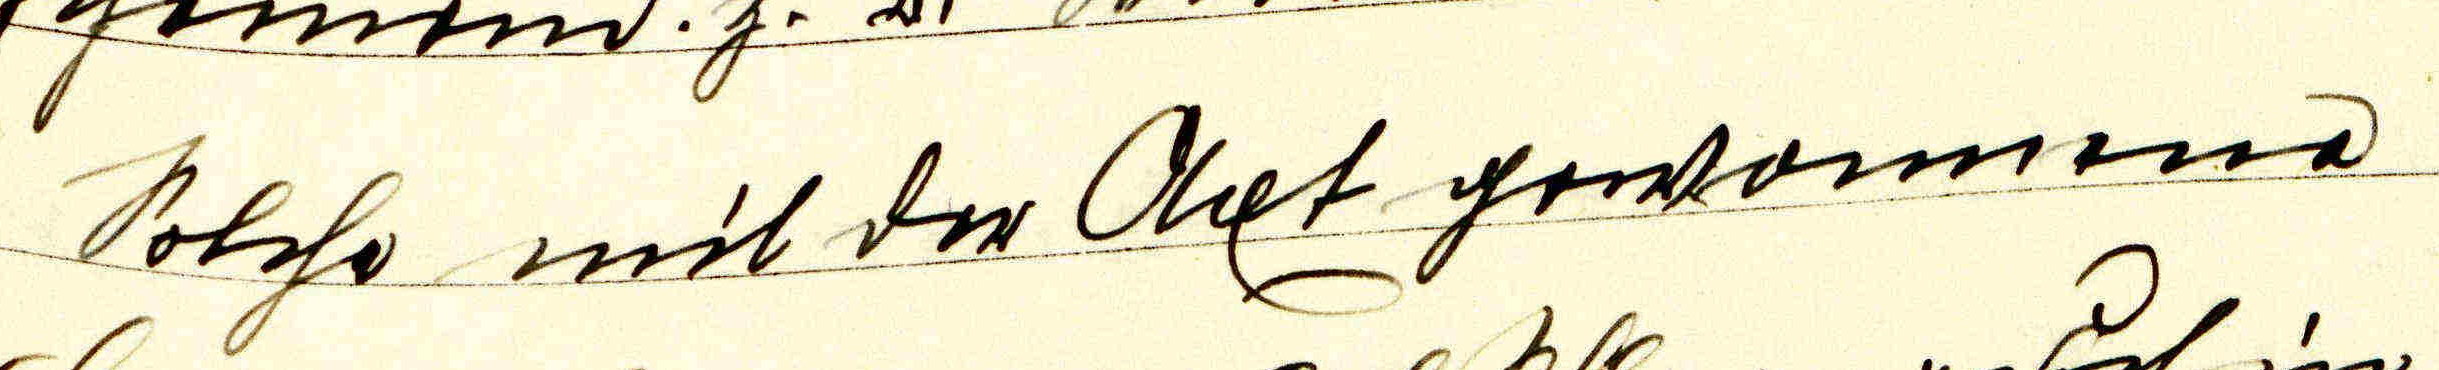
solches wohl ber Art gewonnen
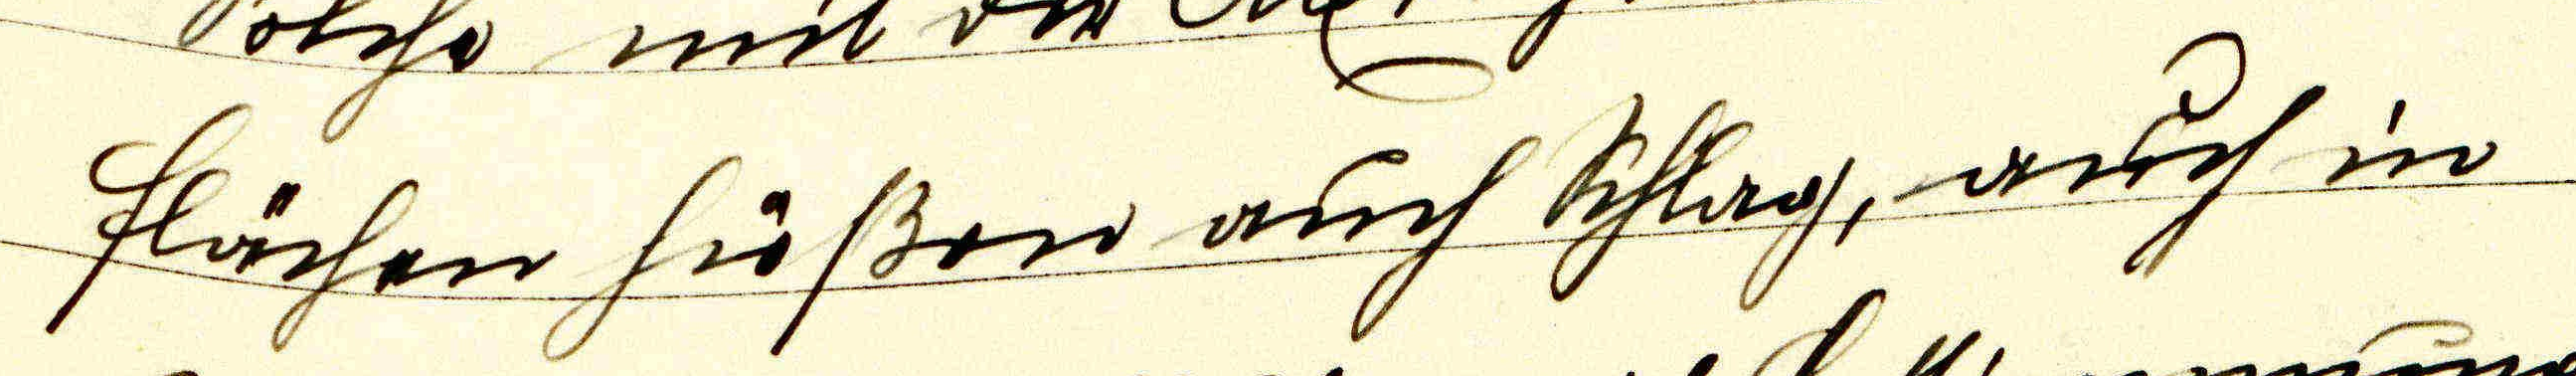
Sachen und als lag, sich die
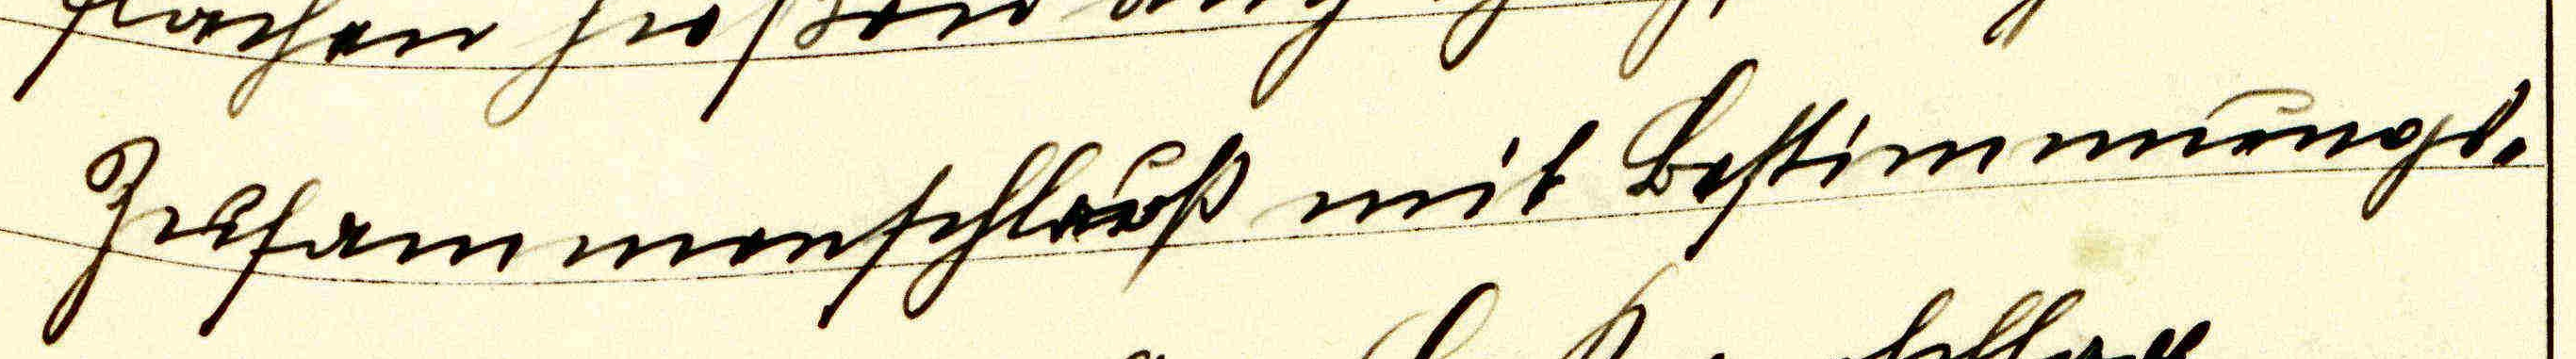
Zisamenschtrß mit esttmmtagt
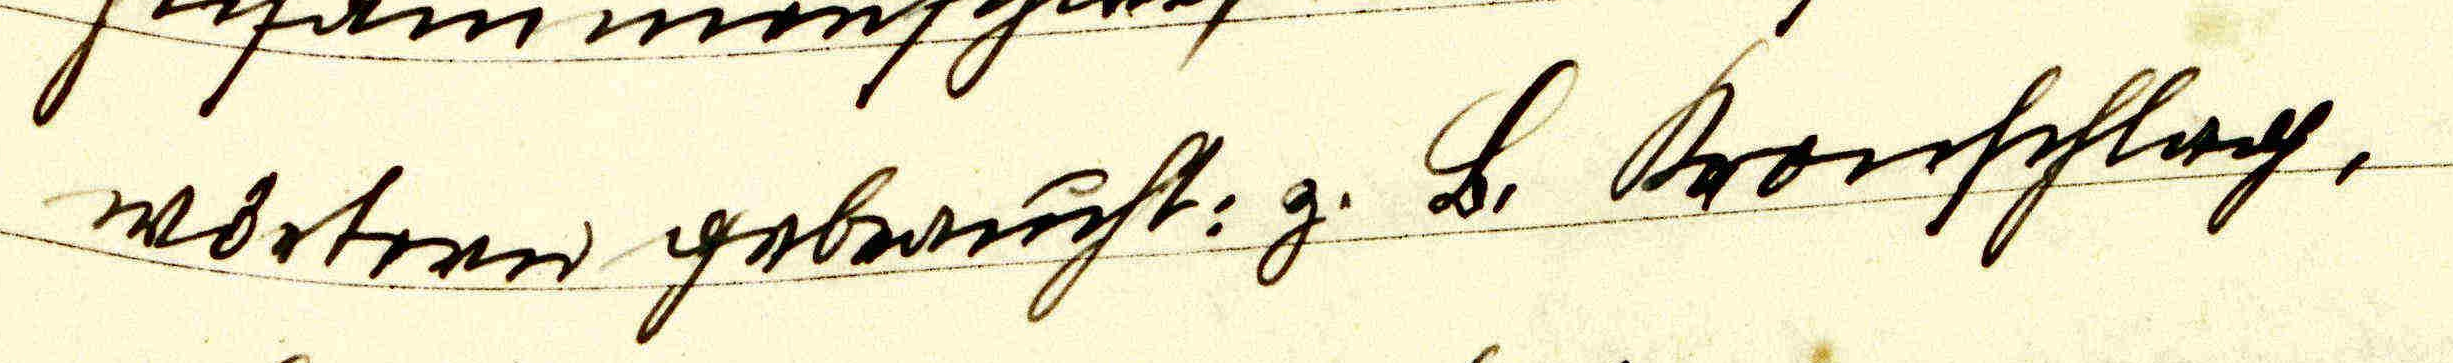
Betrage gebrauch es B ronclag
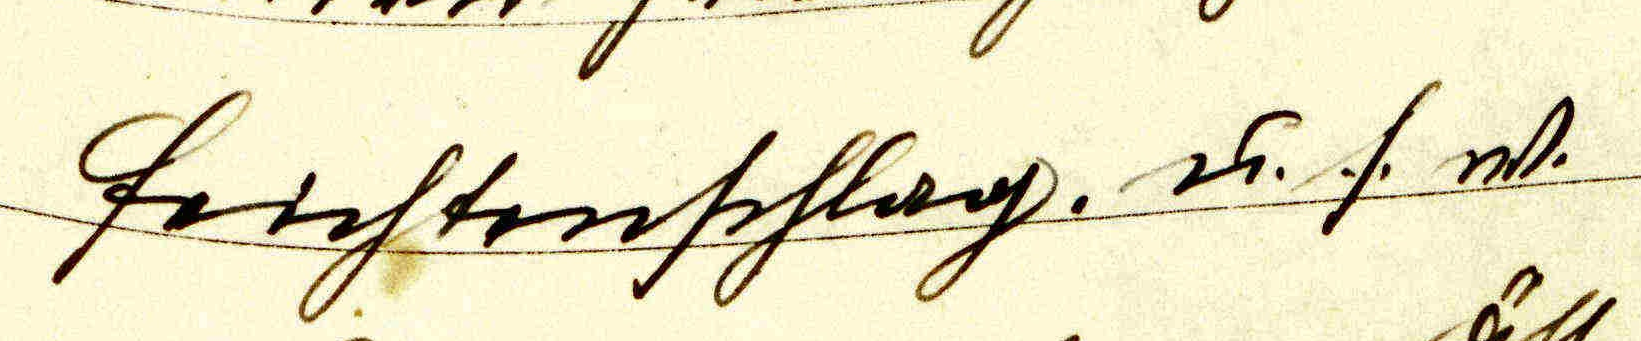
[niehtensahlag Die als
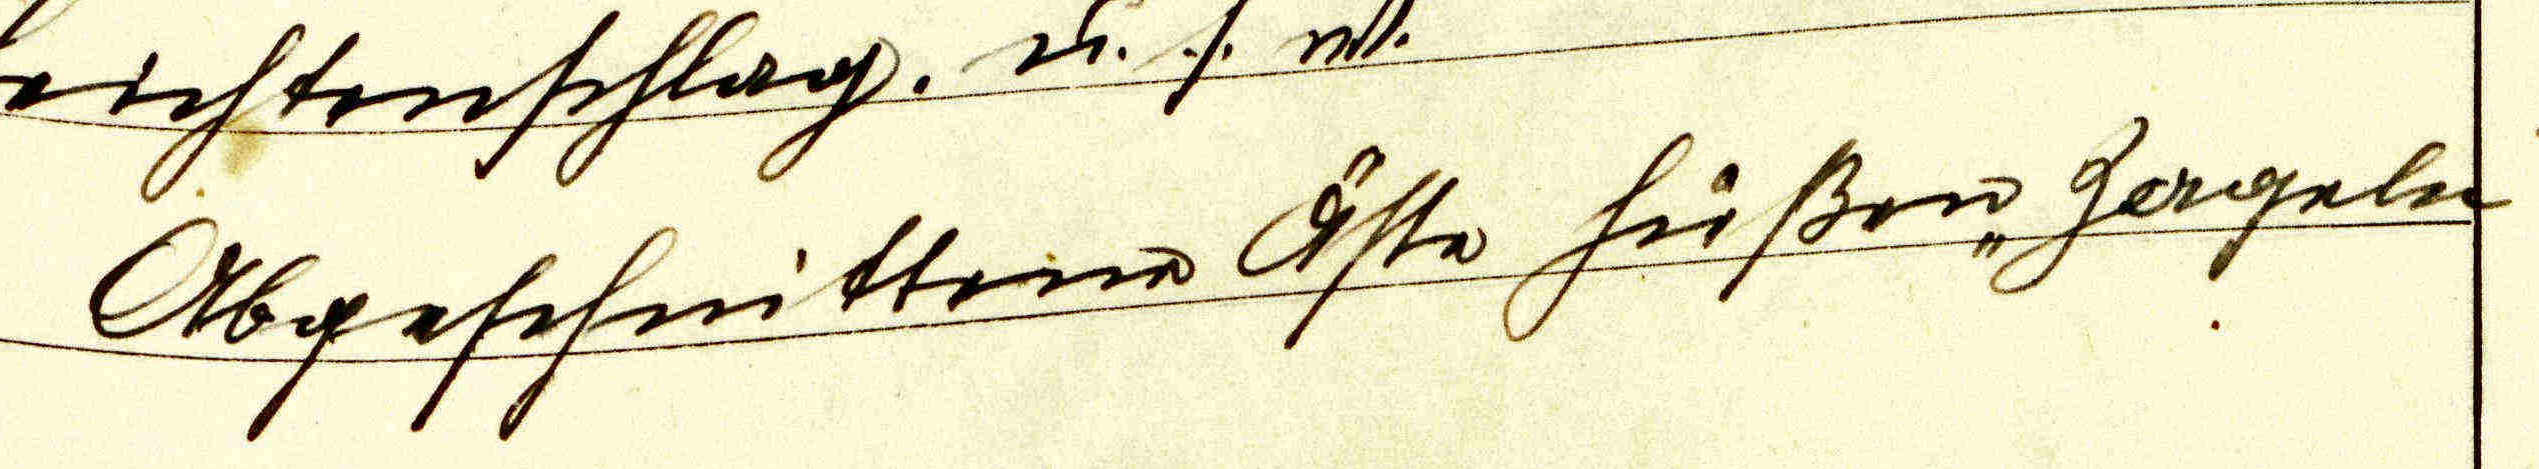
eintragen
